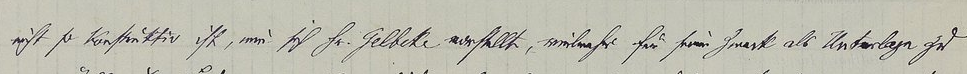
nicht so konstruktiv ist, wie sich Hr. Gelbke vorstellt, vielmehr für seinen Zweck als Unterlage zu
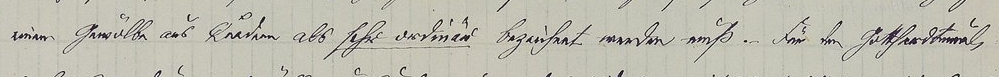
einem Gewölbe aus Quadern als sehr ordinär bezeichnet werden muß. Für den Gotthardtunnel,
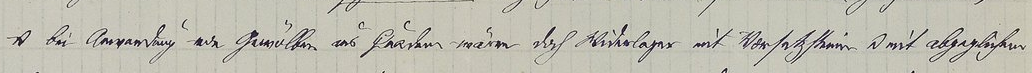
& bei Anwendung von Gewölben aus Quadern wären doch Widerlager mit Vorsetzstein & mit abgeglichnen
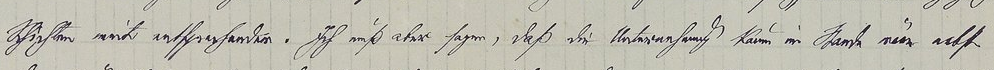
Schichten weit entsprechender. Ich muß aber sagen, daß die Unternehmung kaum im Stande wäre nebst
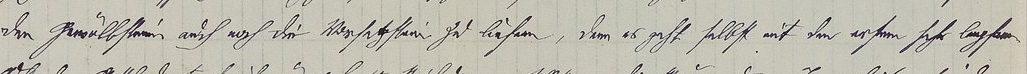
den Gewölbsteinen auch noch die Vorsetzsteine zu liefern, denn es geht selbst mit den erstren sehr langsam.
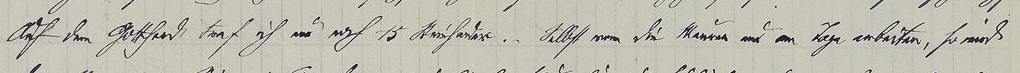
Auf dem Gotthard traf ich nur noch 15 Steinhauer. – Selbst wenn die Maurer nur am Tage arbeiten, so wird
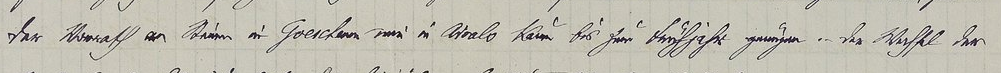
der Vorrath an Steinen in Goeschenen wie in Airolo kaum bis zum Frühjahr genügen. Der Wechsel der
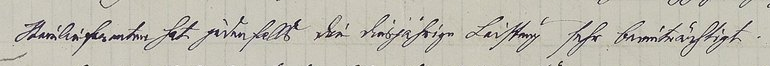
Steinlieferanten hat jedenfalls die diesjährige Leistung sehr beeinträchtigt.
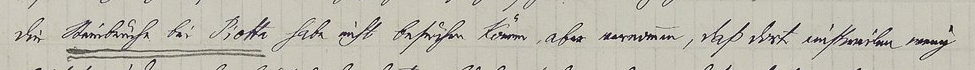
Die Steinbrüche bei Piotta habe nicht besuchen können, aber vernommen, daß dort einstweilen wenig
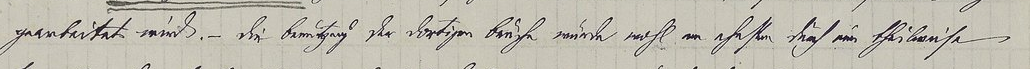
gearbeitet wird. – Die Benutzung der dortigen Brüche würde wohl am ehesten durch eine theilweise
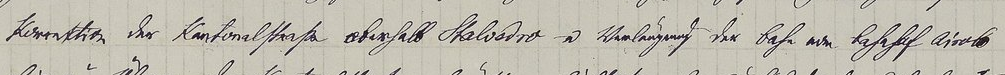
Korrektion der Kantonalstraße oberhalb Stalvedro & Verlängerung der Bahn vom Bahnhof Airolo
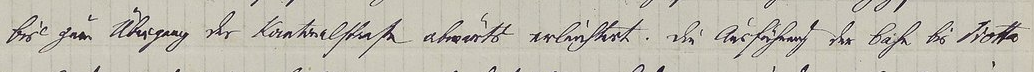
bis zum Übergang der Kantonalstraße abwärts erleichtert. Die Ausführung der Bahn bis Piotta
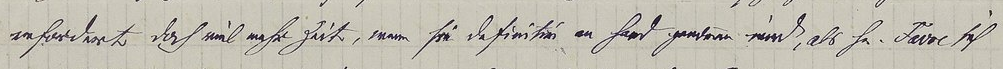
erfordert doch viel mehr Zeit, wenn sie definitiv an Hand genommen wird, als Hr. Favre sich
